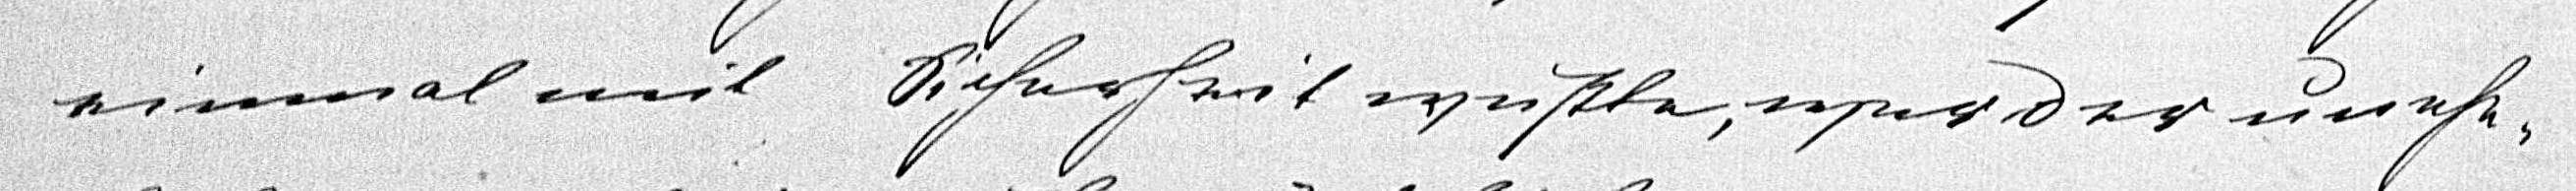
einmal mit Sicherheit wußte, wer der unehe¬
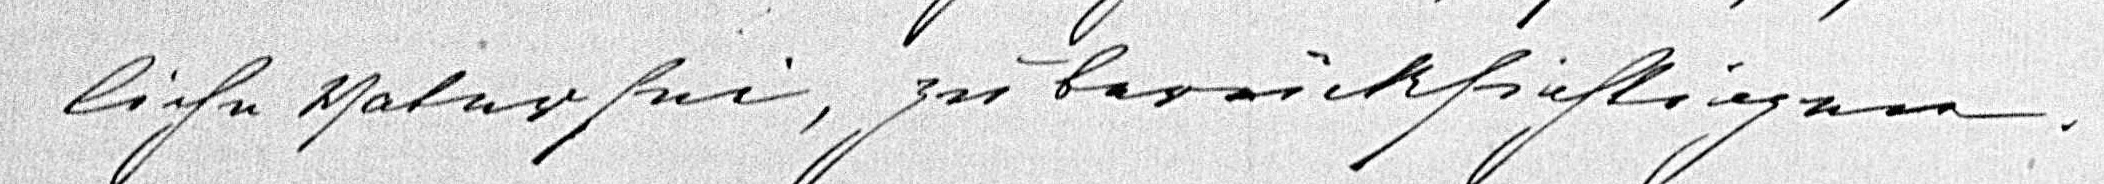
liche Vater sei, zu berücksichtigen.
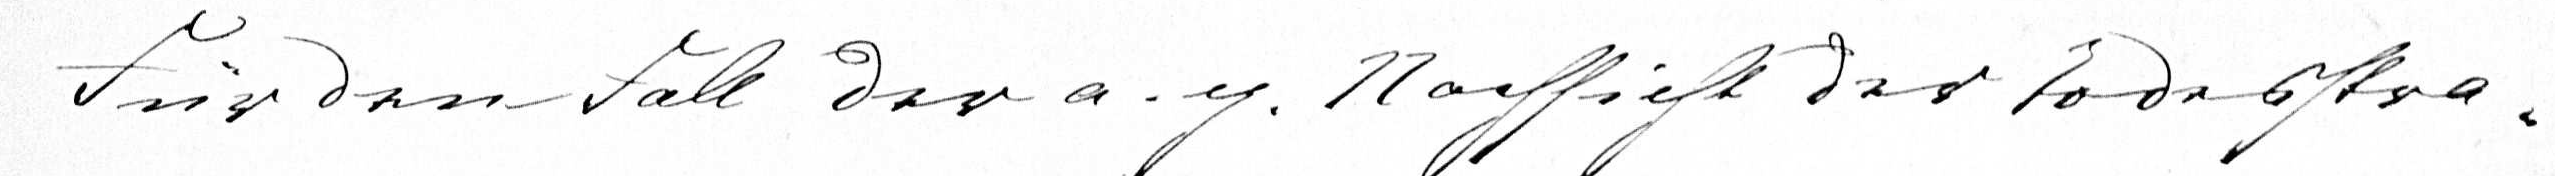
Für den Fall der a.g. Nachsicht er Todesstra¬
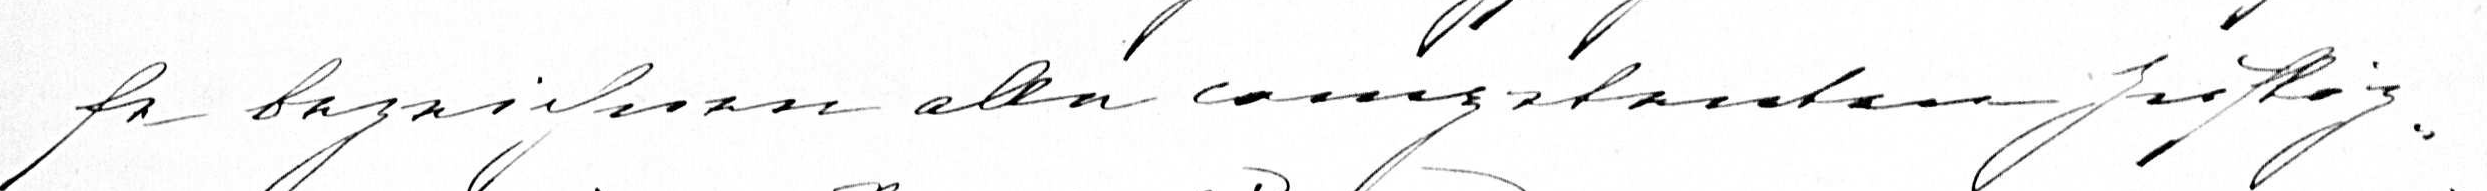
fe bezeichnen alle competenten Justiz¬
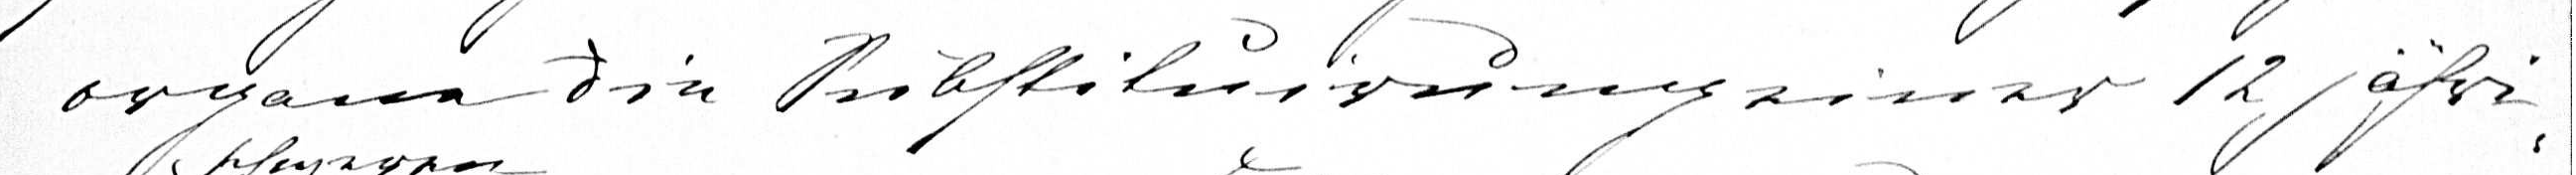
organe die Substituirung einer 12 jähri¬
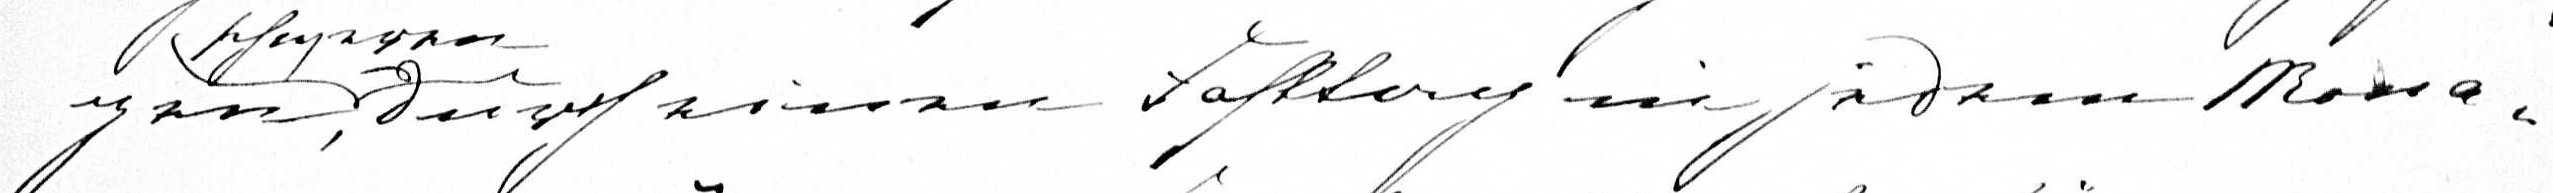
gen, schweren durch einen Fasttag im jeden Mona¬
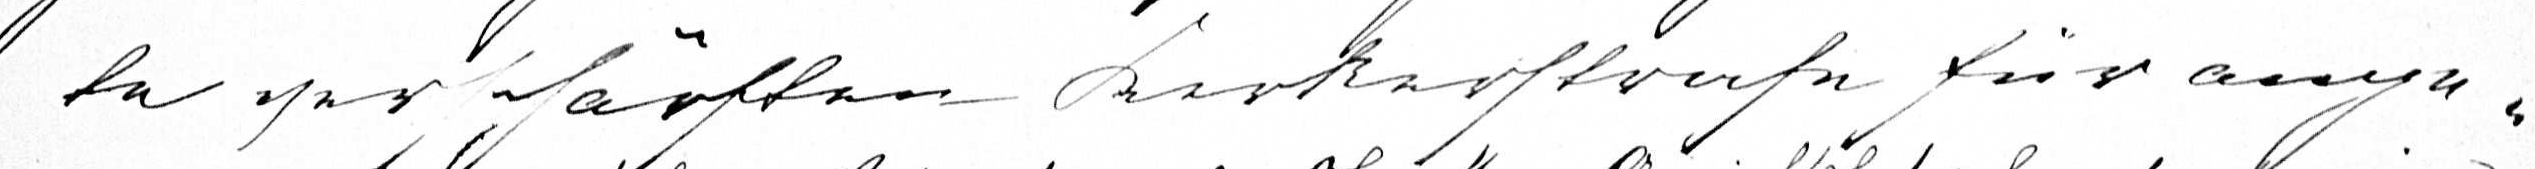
te verschärften Kerkerstrafe für ange¬
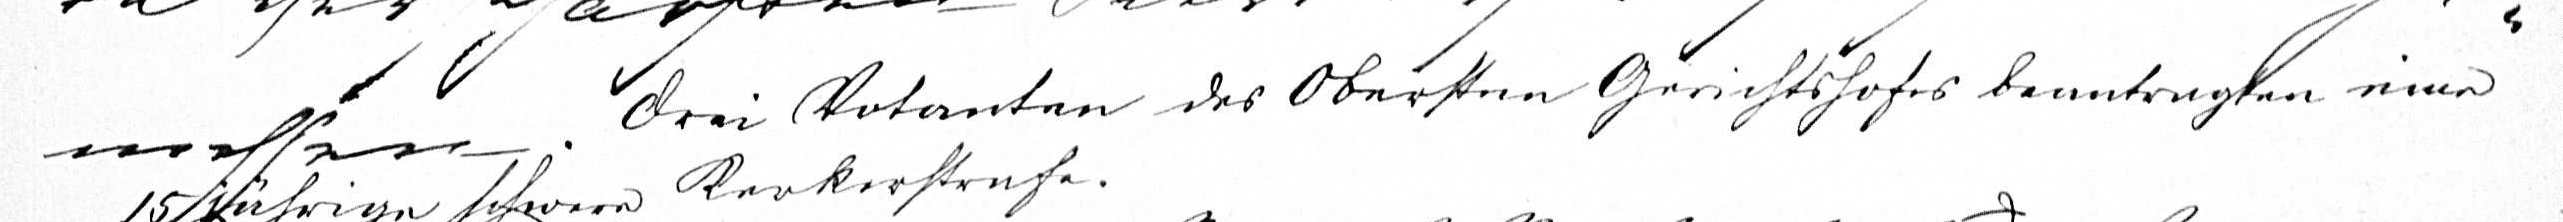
messen. Drei Votanten des Obersten Gerichtshofes beantrage eine
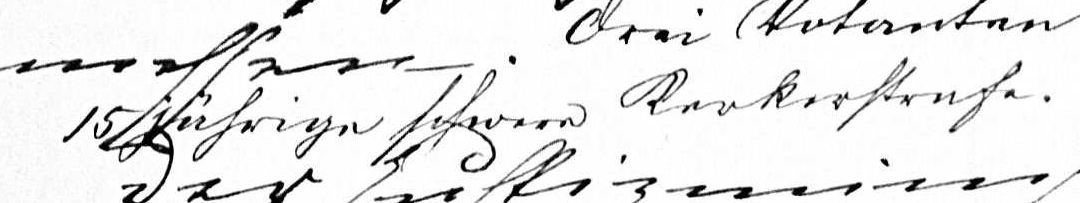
15 jährige schwere Kerkerstrafe.
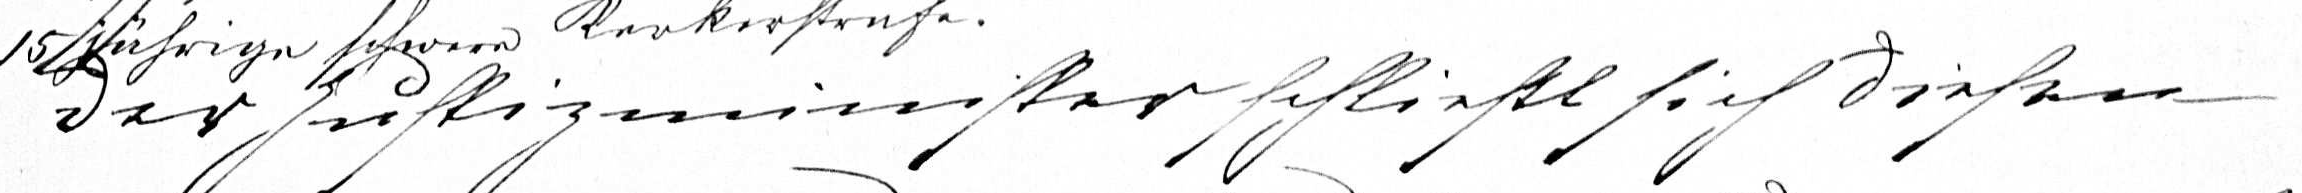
Der Justizminister schließt sich diesen
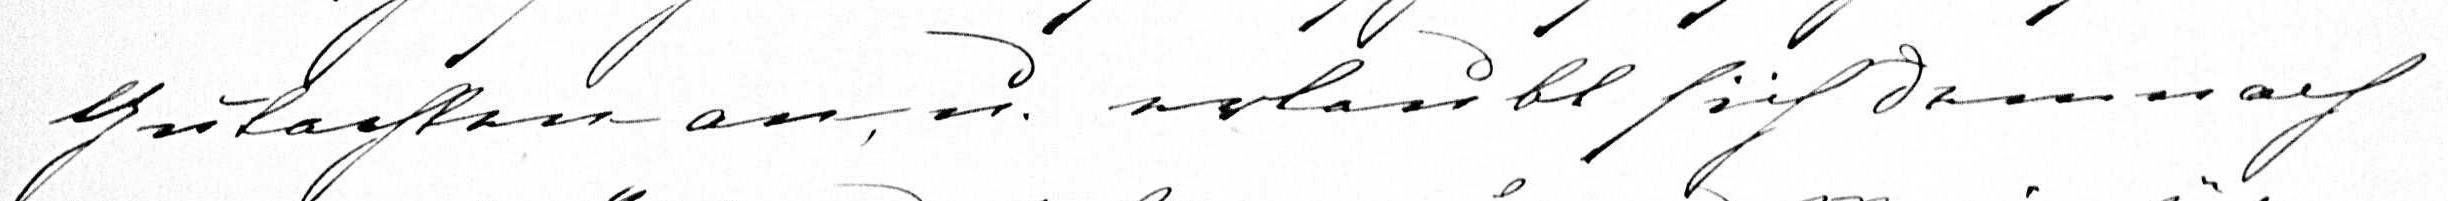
Gutachten an, u. erlaubt sich demnach
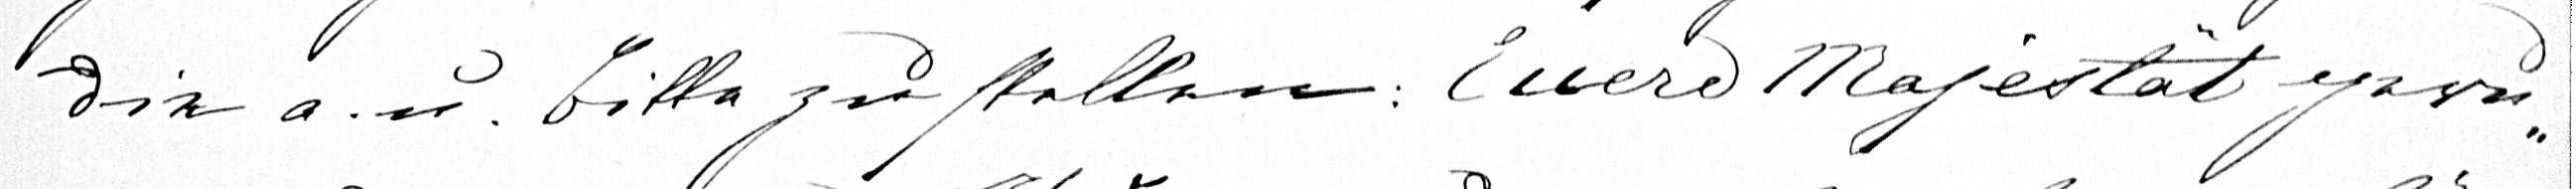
die a.u. Bitte zu stellen: Euere Majestät geru¬
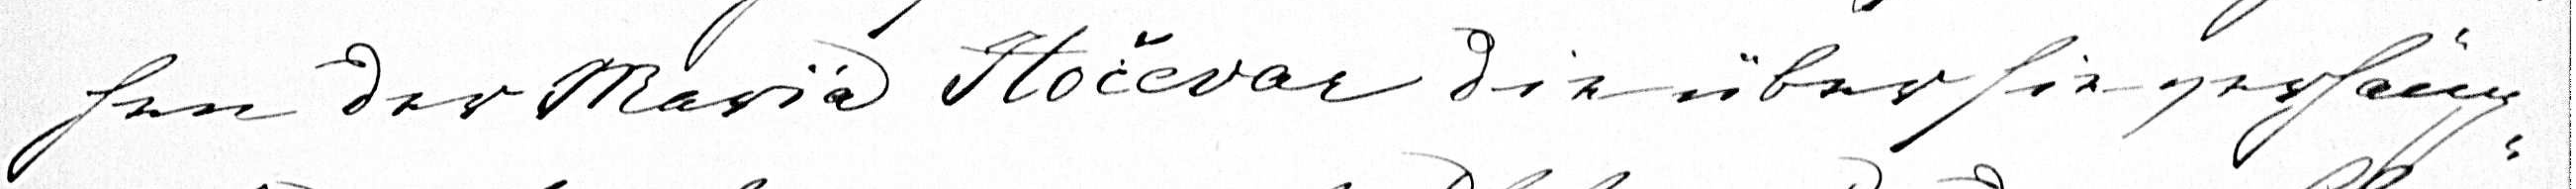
hen der Maria Hočevar die über sie verhäng¬
